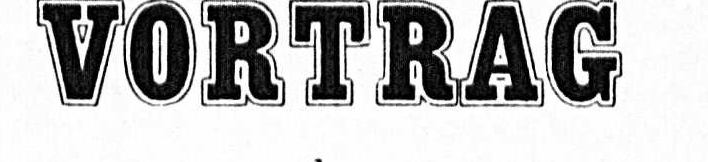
Vortrag
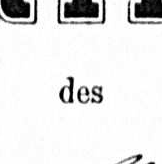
des
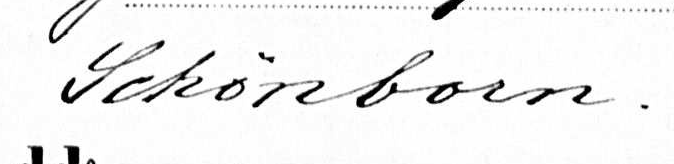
Schönborn.
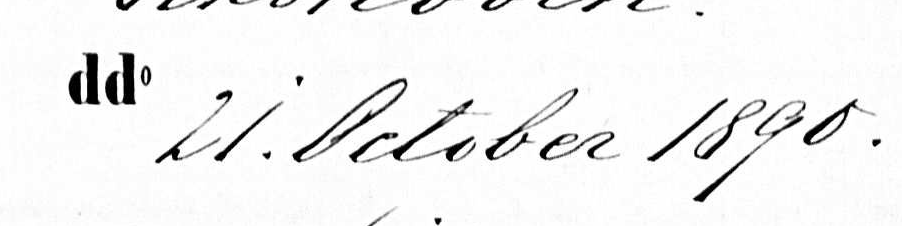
ddo 21. October 1890.
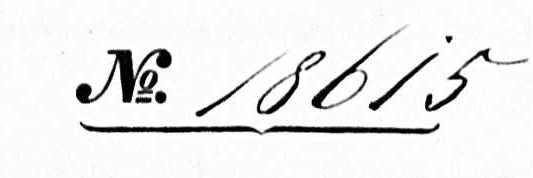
No. 18615
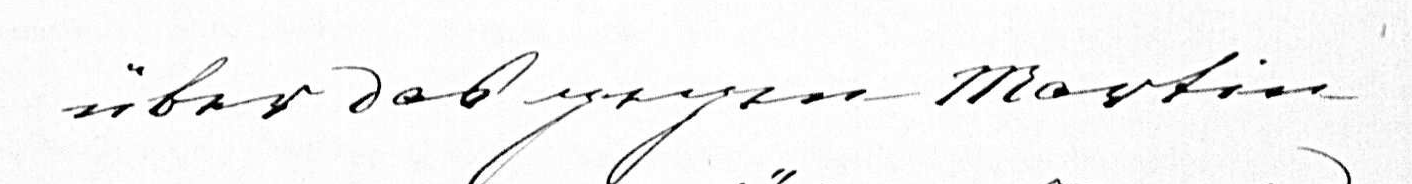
über das gegen Martin
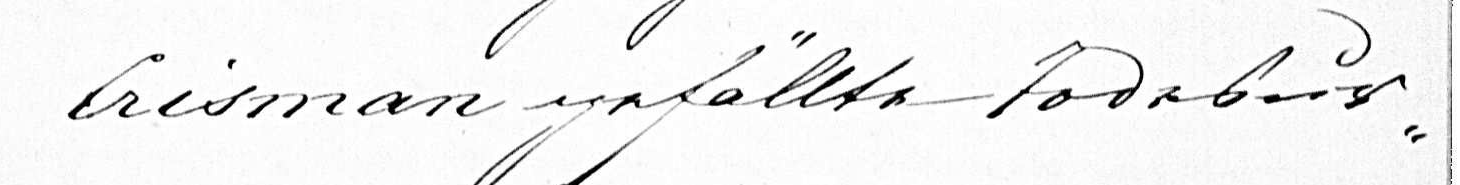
Crisman gefällte Todesur¬
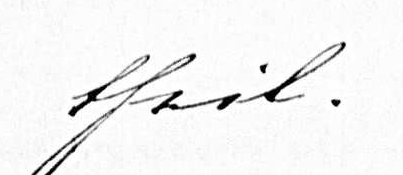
theil.
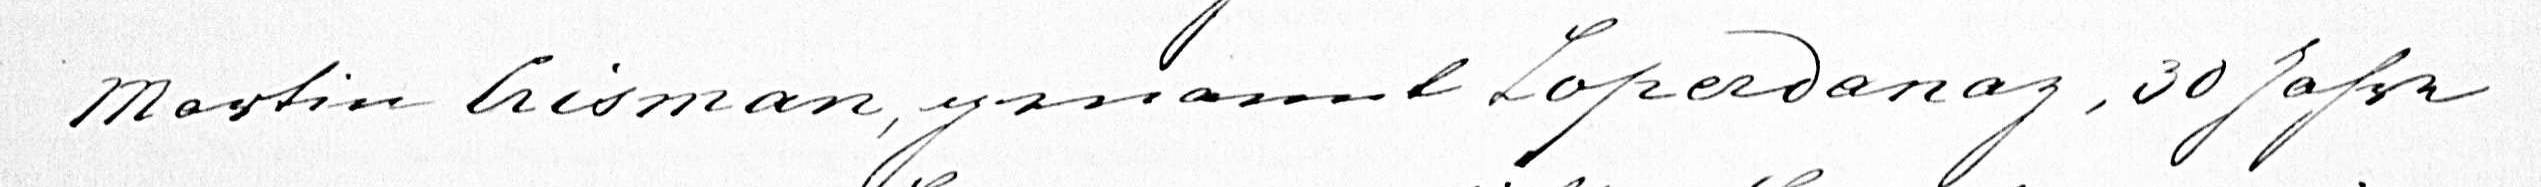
Martin Crisman, genannt Loperdanaz, 30 Jahre
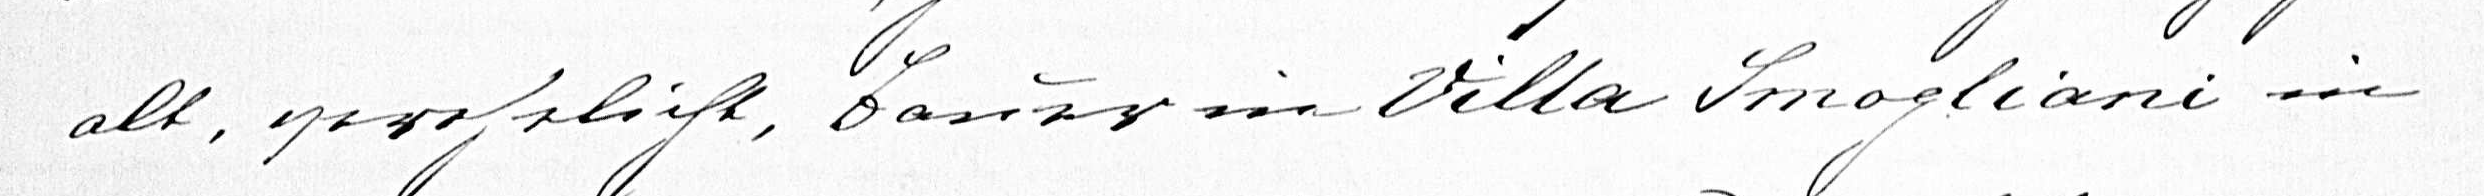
alt, verehelicht, Bauer in Villa Smogliani in
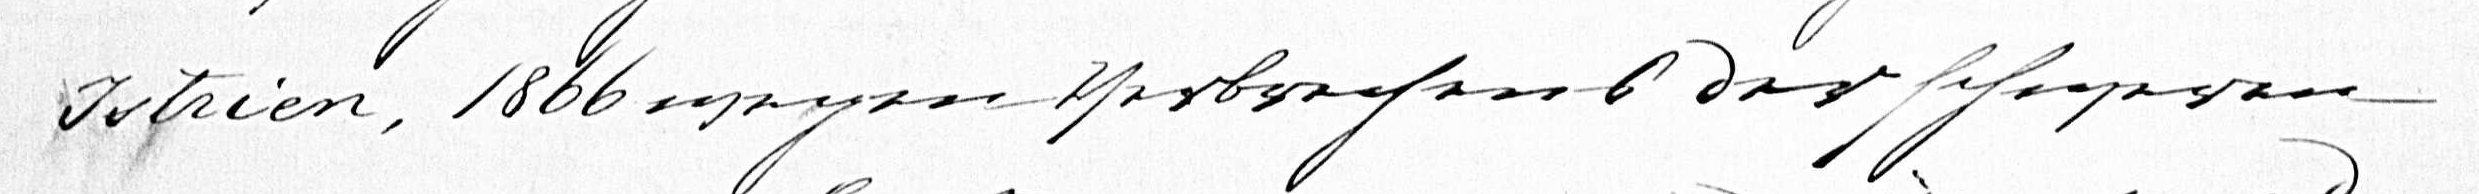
Istrien, 1866 wegen Verbrechens der schweren
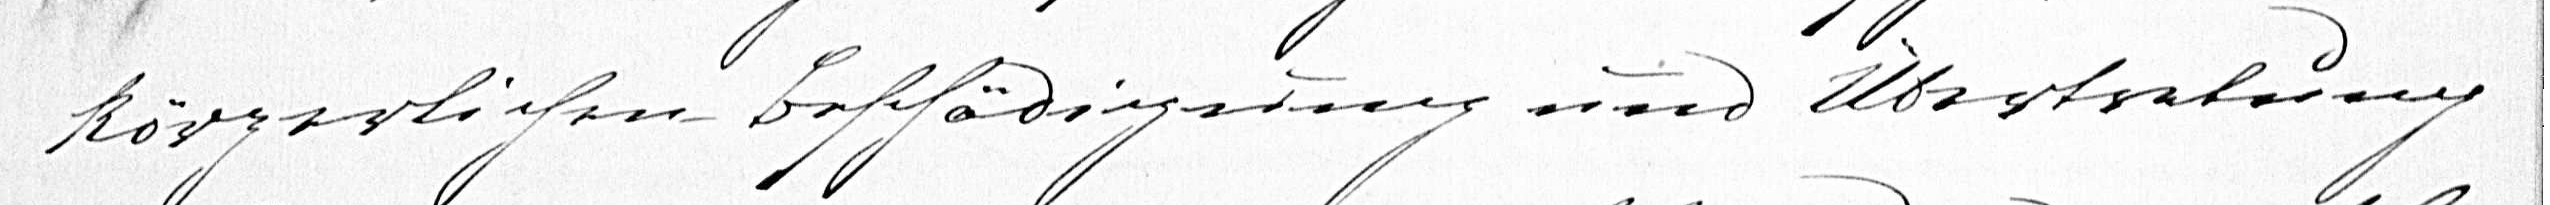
körperlichen Beschädigung und Übertretung
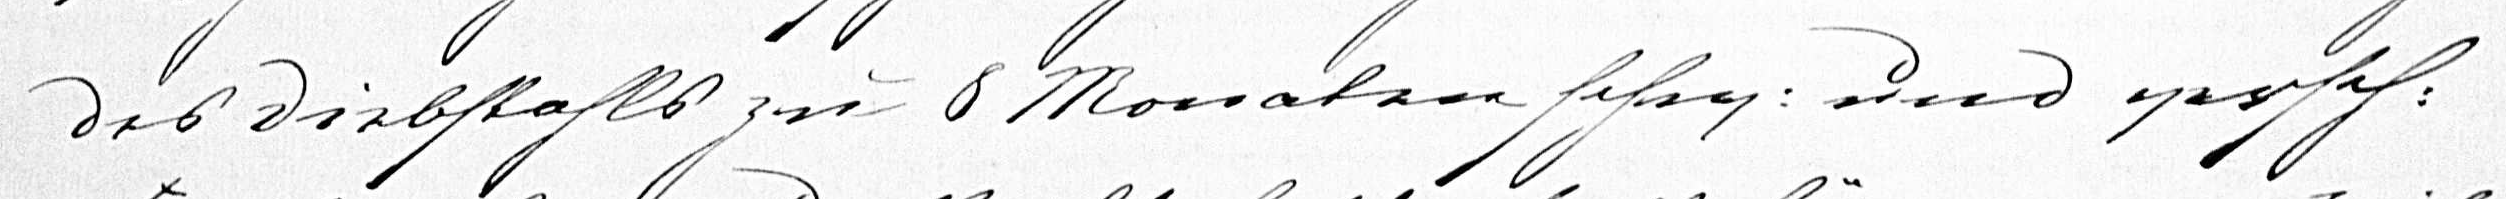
des Diebstahls zu 8 Monaten schev: und versch:
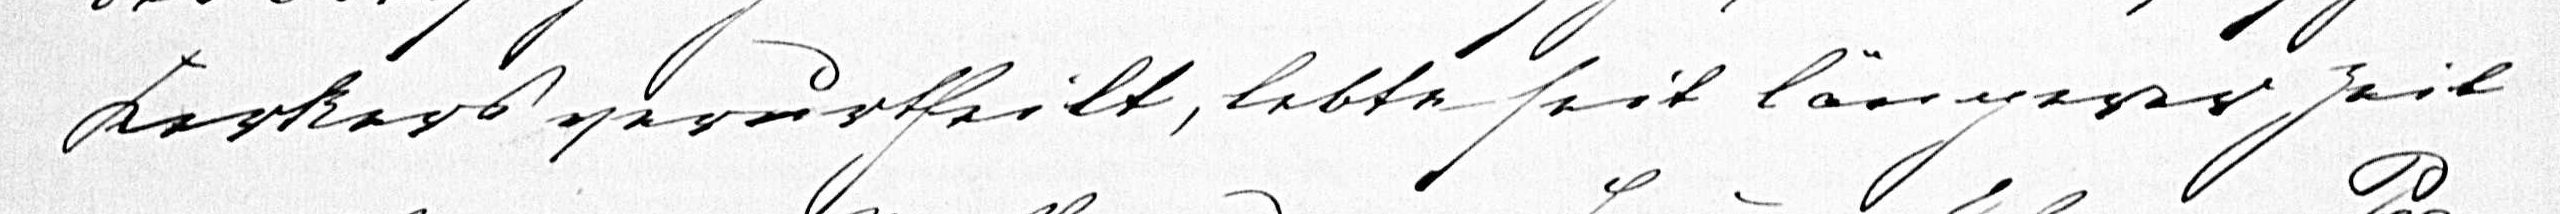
Kerkers verurtheil, lebte seit längerer Zeit
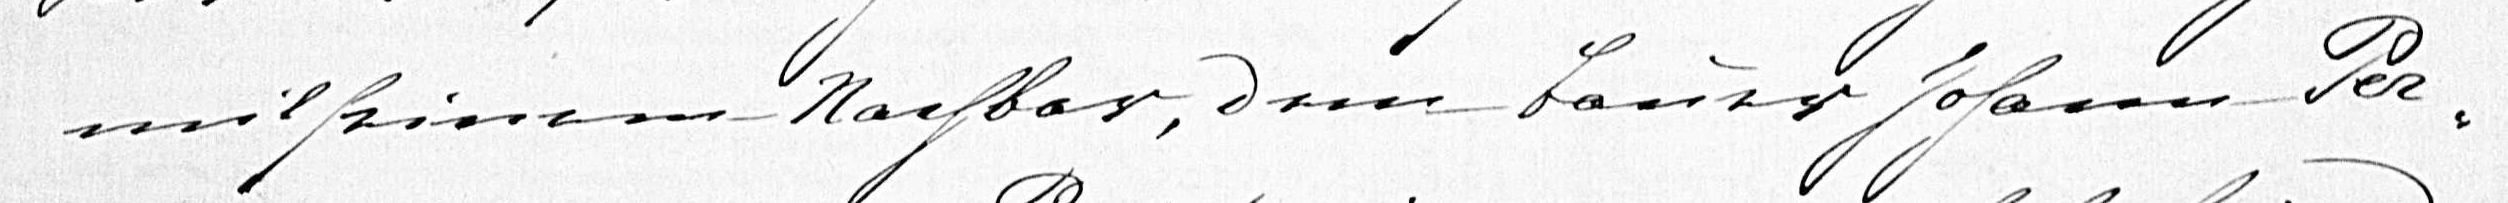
mit seinem Nachbar, dem Bauer Johann Per¬
